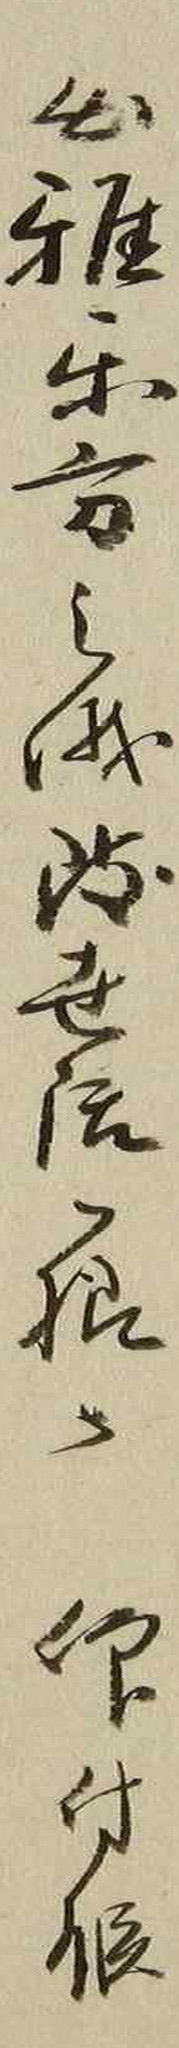出雅楽方之儀致世話候様被仰付候
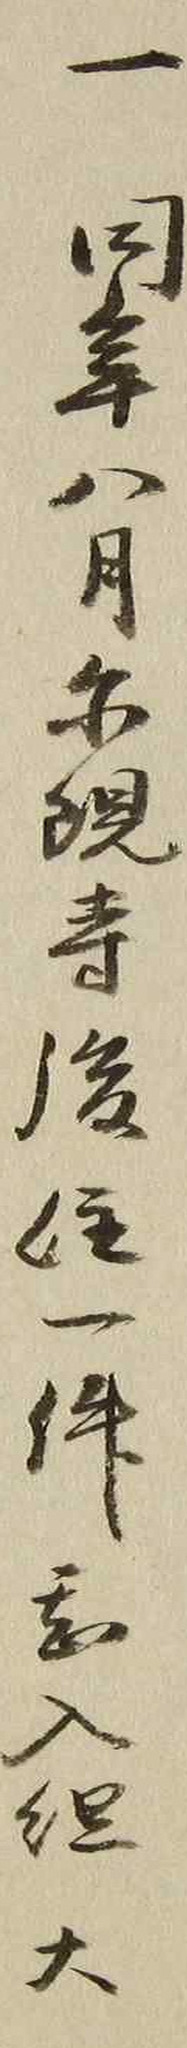一同年八月示現寺後住一件甚入組大
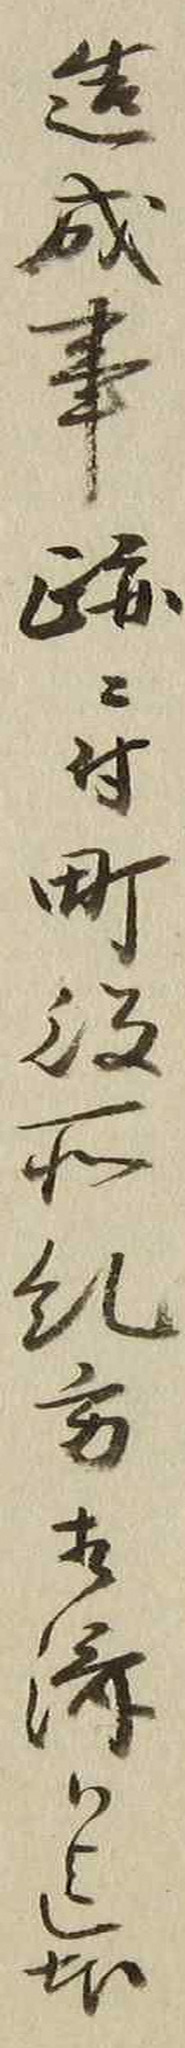造成事跡ニ付町役所糺方相済候迄本
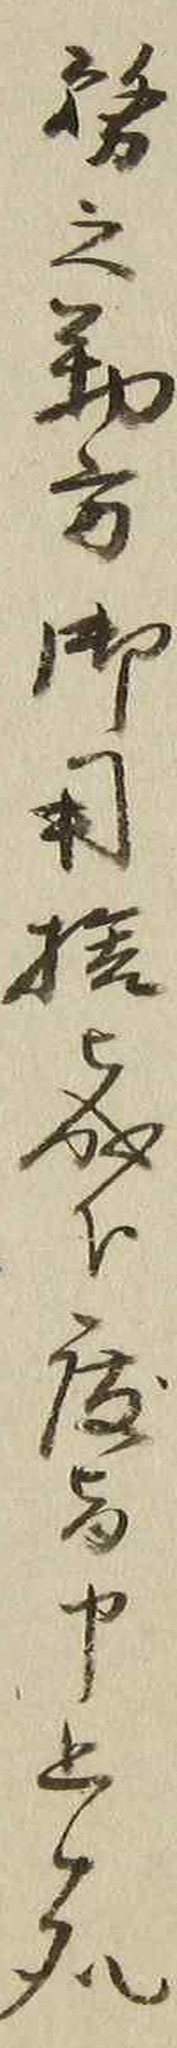務之勤方御用捨被成下度旨申上候処
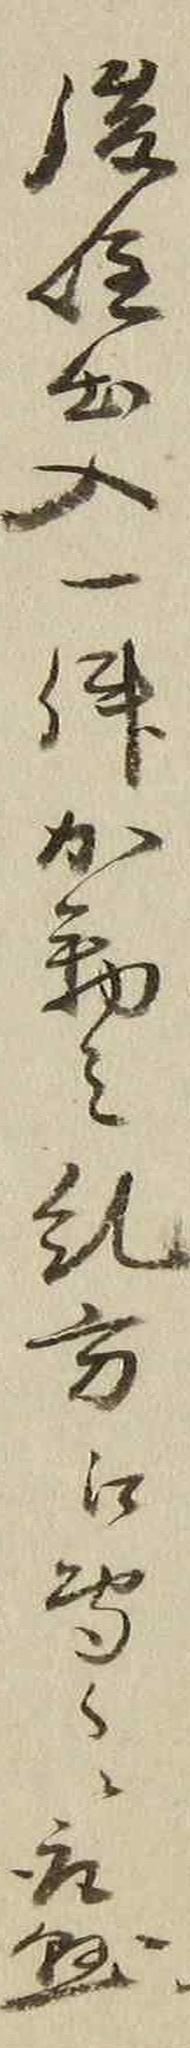後住出入一件加勤之糺方江専らニ取懸
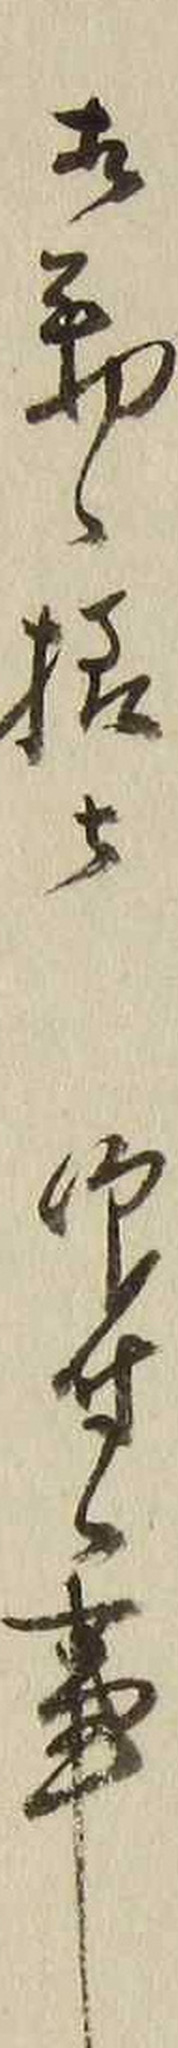相勤候様被仰付候事
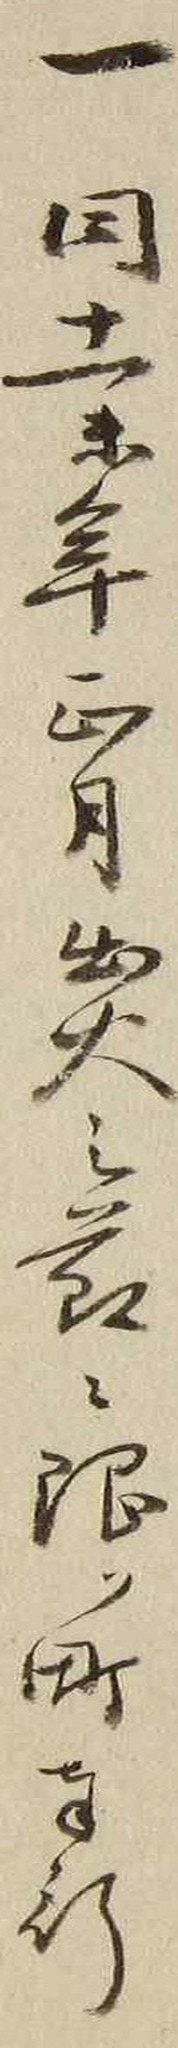一同十一未年正月出火之節ニ限り町奉行
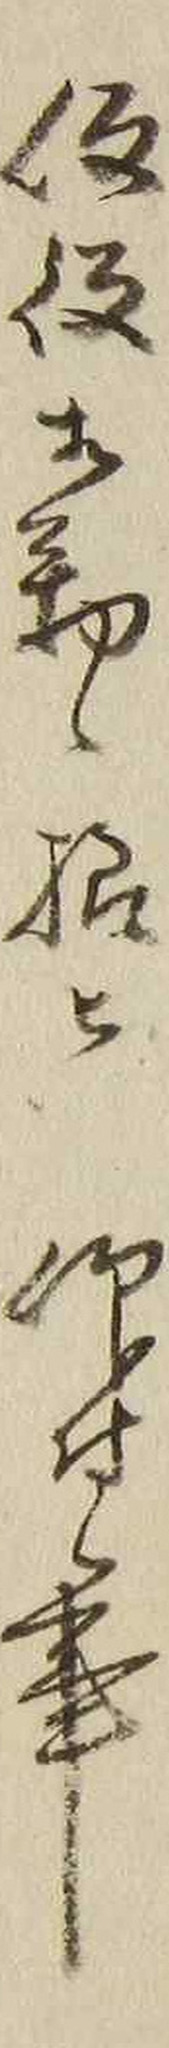仮役相勤候様被仰付候事
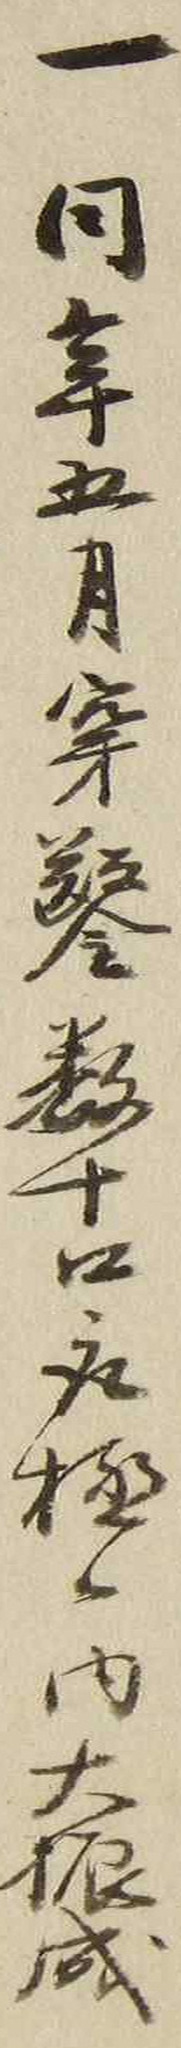一同年五月穿鑿数十口取極候内大振成
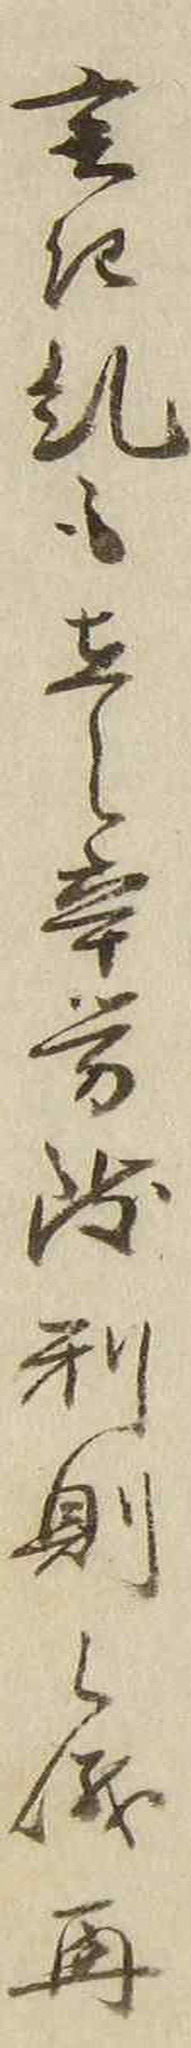重き糺も在之辛労致刑則之儀再

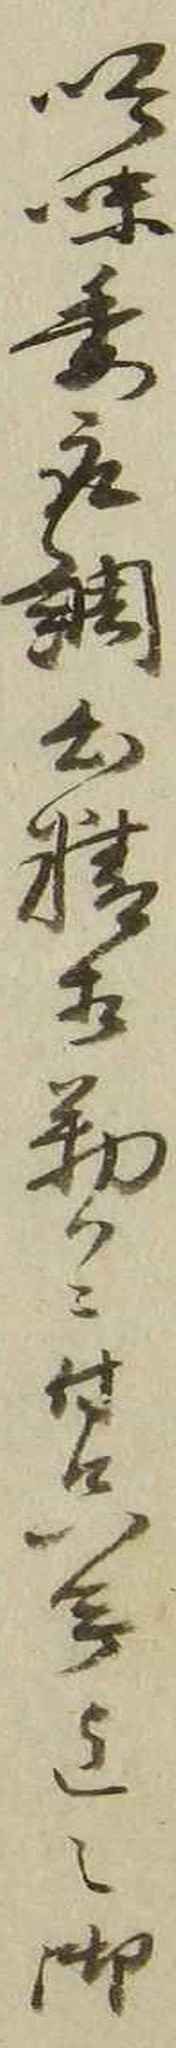吟味委取調出精相勤候ニ付只今迄之御
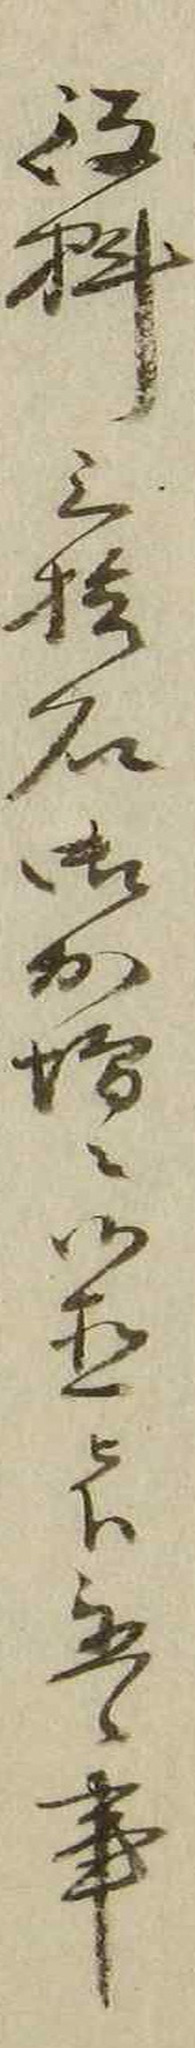役料三拾石御加増ニ御直被下置候事
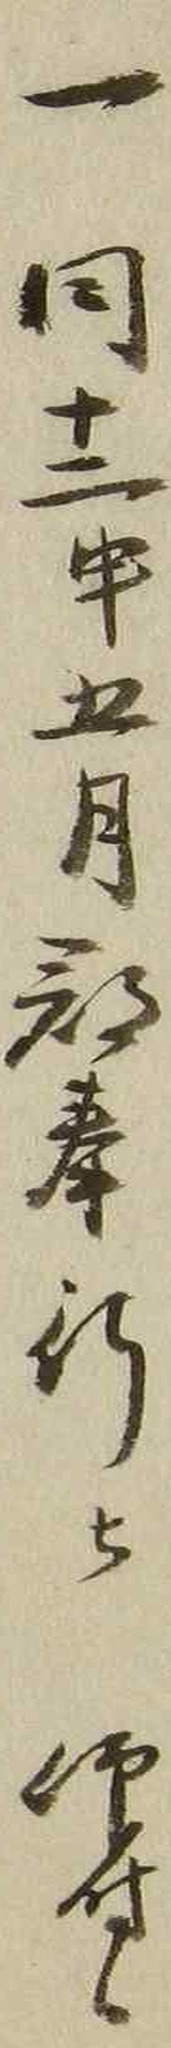一同十二申五月郡奉行被仰付候
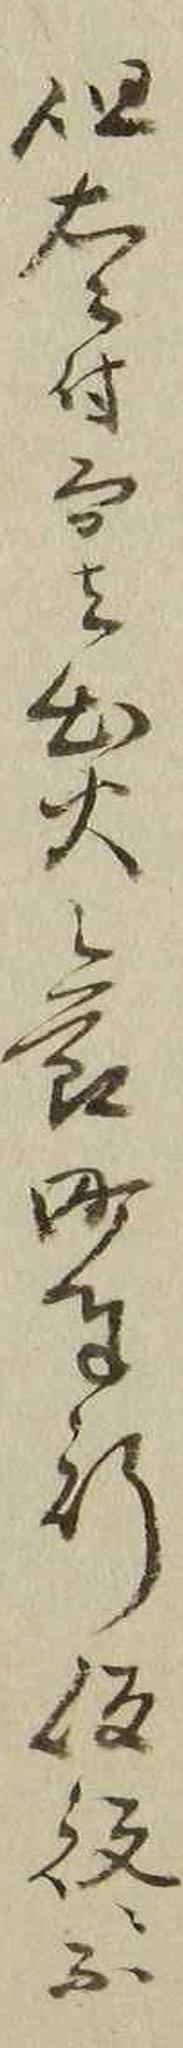但右ニ付而者出火之節町奉行仮役ニ不
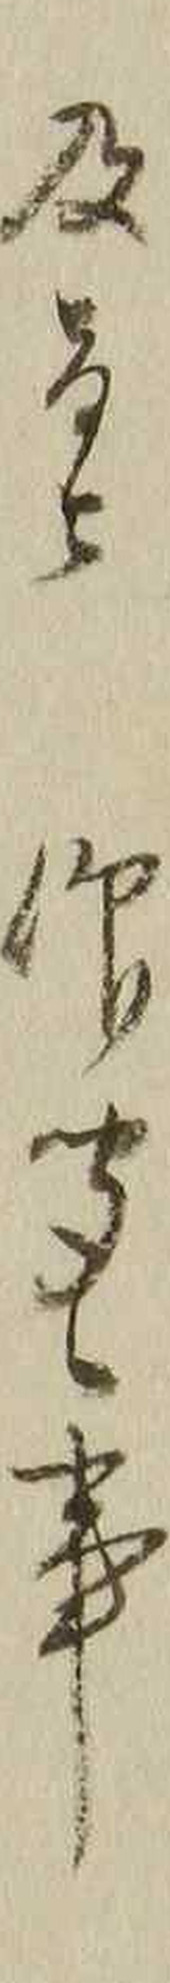及旨被仰聞候事
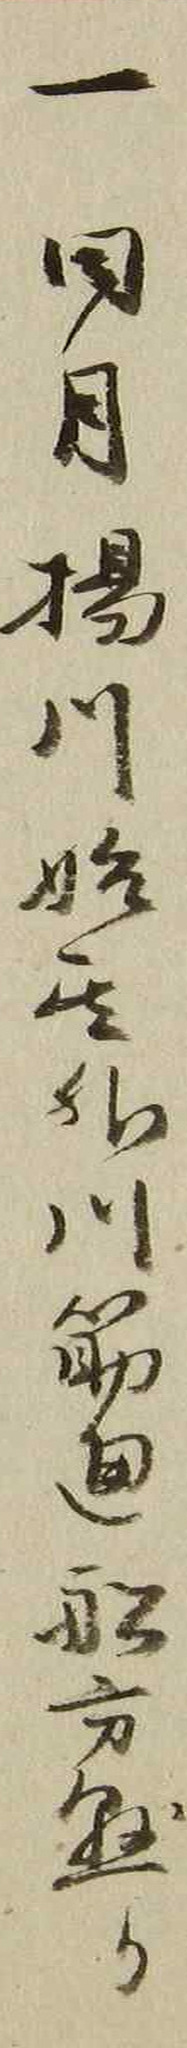一同月楊川始其外川筋通舩方懸り
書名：諸士系譜　巻之261　あ之部14
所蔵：会津若松市立会津図書館
